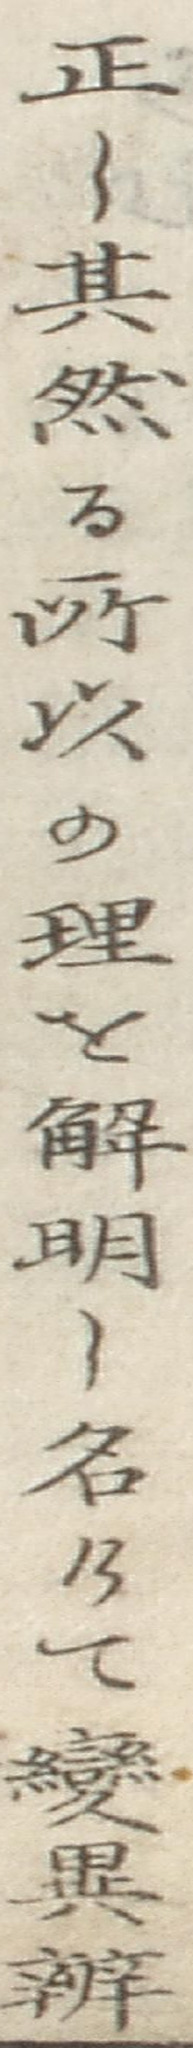正し其然る所以の理を解明し名けて変異辨
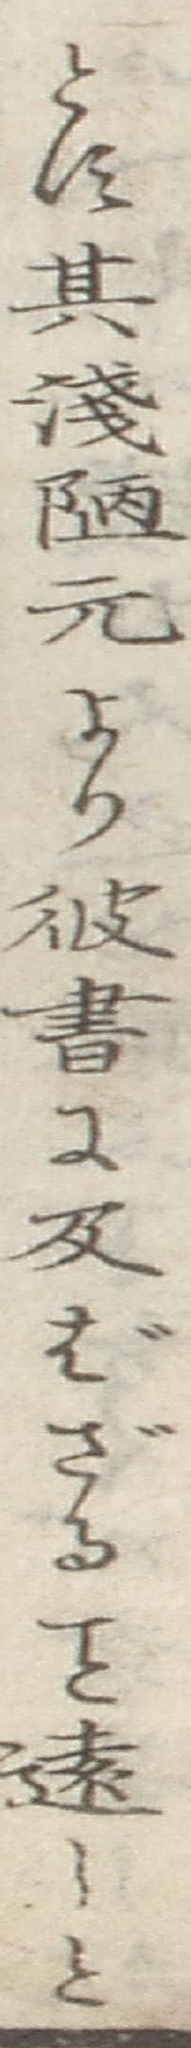とす其浅陋元より彼書に及ばざること遠しと

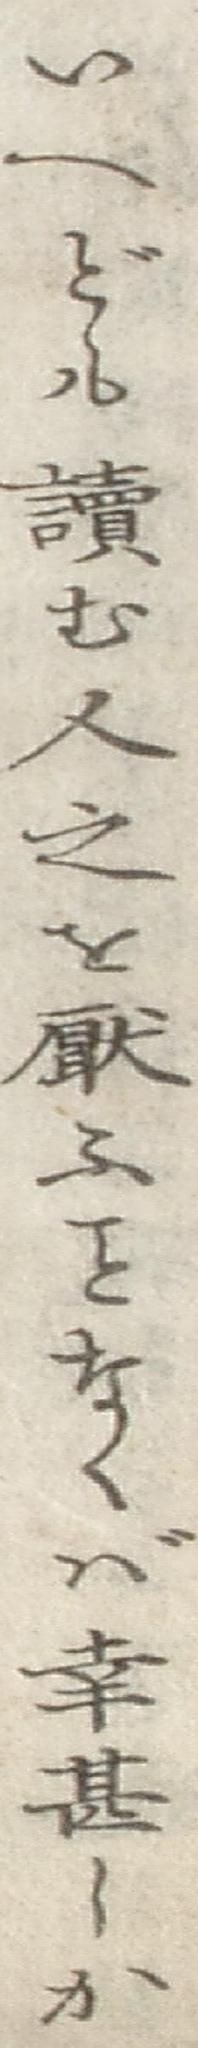いへども読む人之を厭ふことなくば幸甚しか
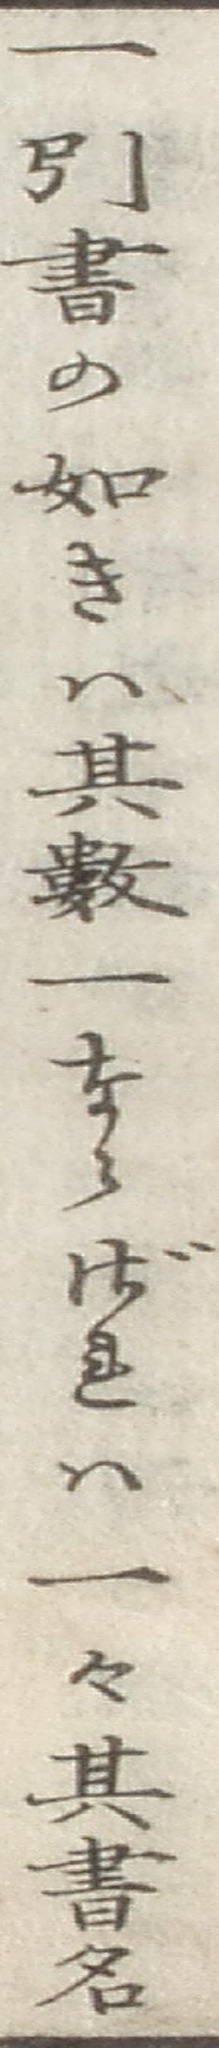一引書の如きは其数一ならざれは一々其書名
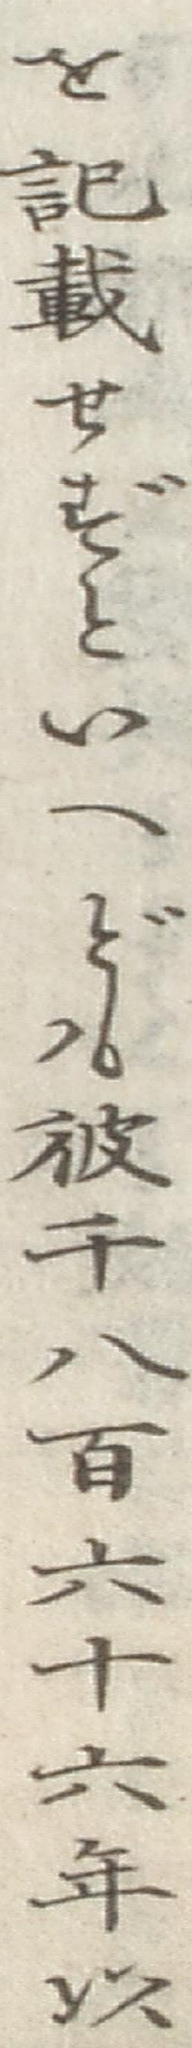を記載せずといへども彼千八百六十六年以
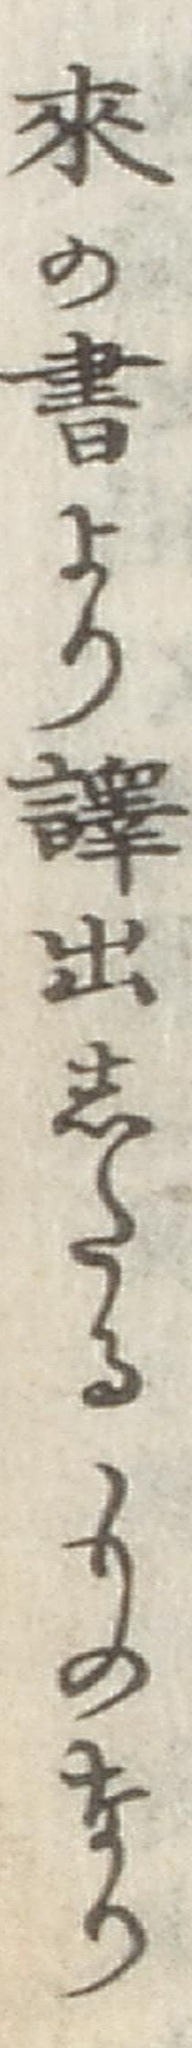来の書より訳出したるものなり
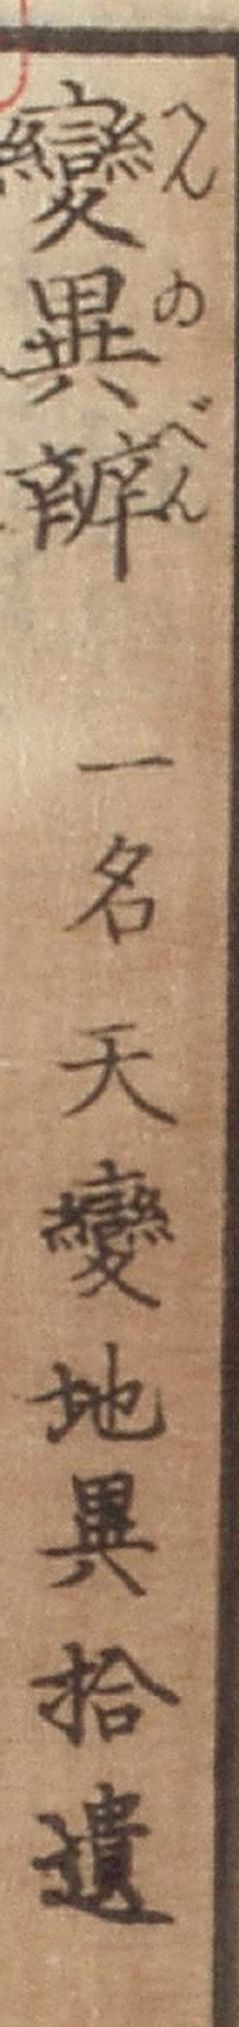変異辨一名天変地異拾遺
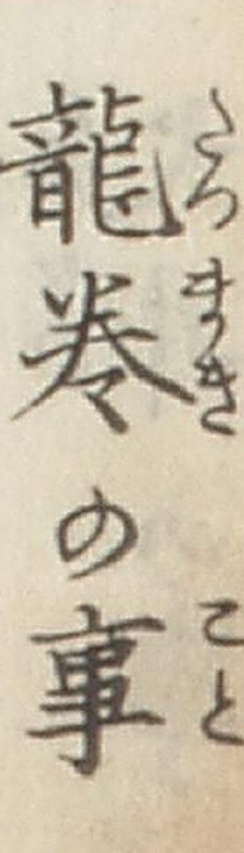龍巻の事
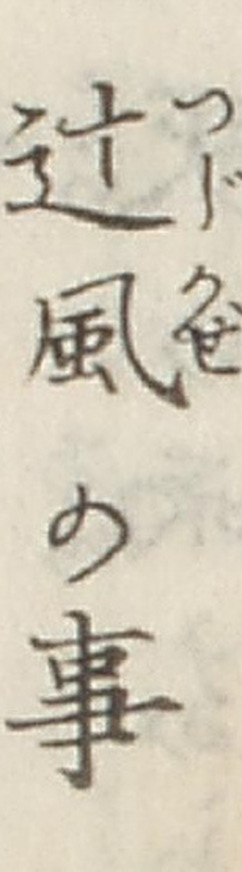辻風の事
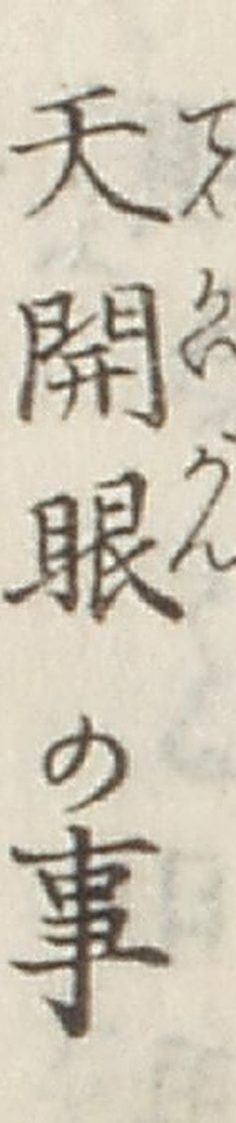天開眼の事
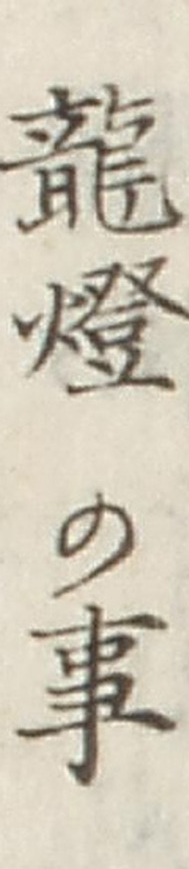龍燈の事
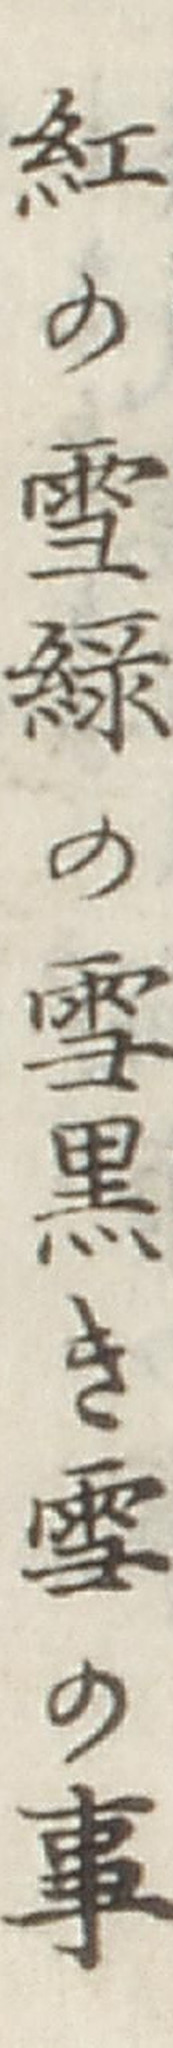紅の雪緑の雪黒き雪の事
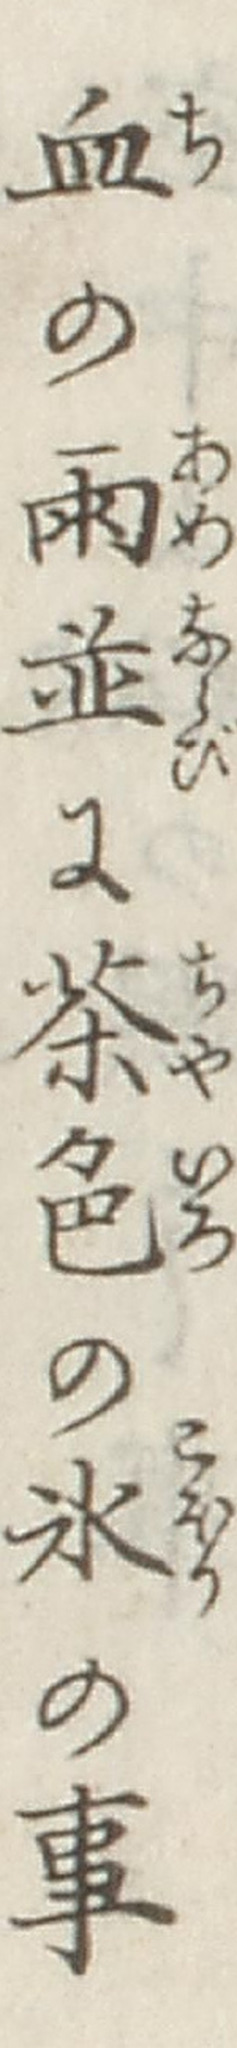血の雨並に茶色の氷の事
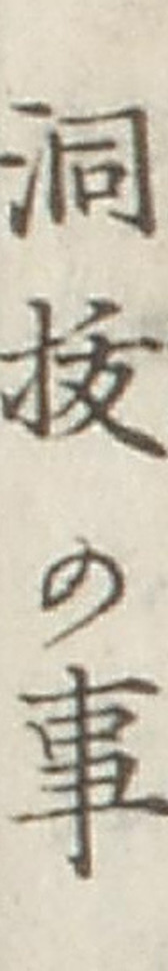洞抜の事

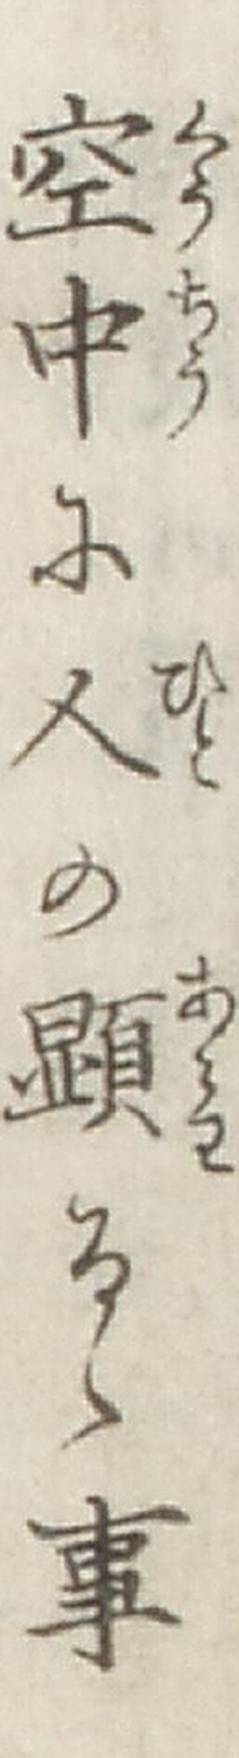空中に人の顕るゝ事
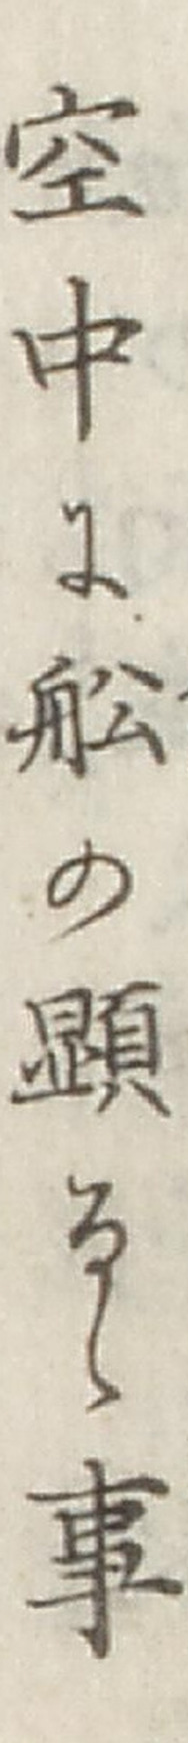空中に船の顕るゝ事
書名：変異辯　一名、天變地異拾遺　全
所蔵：東京大学地震研究所図書室 Earthquake Research Institute Library, The University of Tokyo, JAPAN
